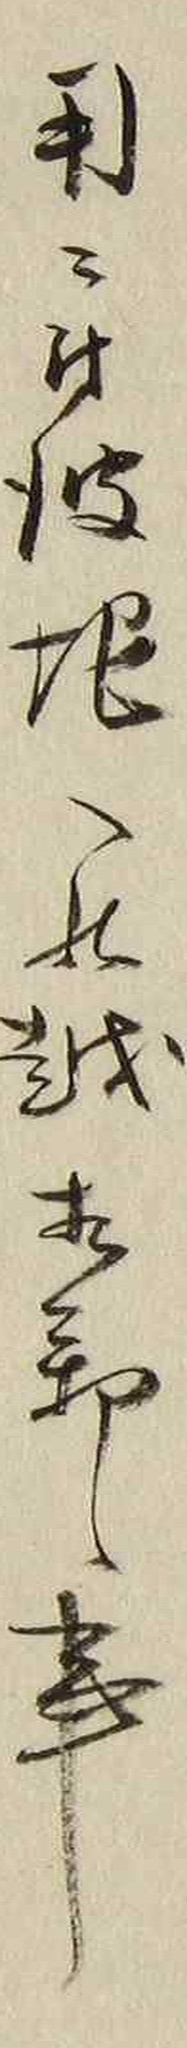用に付彼地へ罷越相勤候事
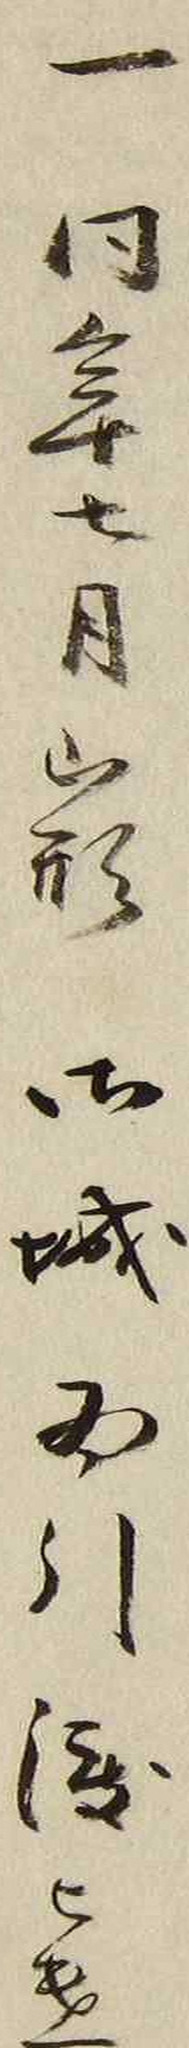一同年七月山形御城為引渡被遣
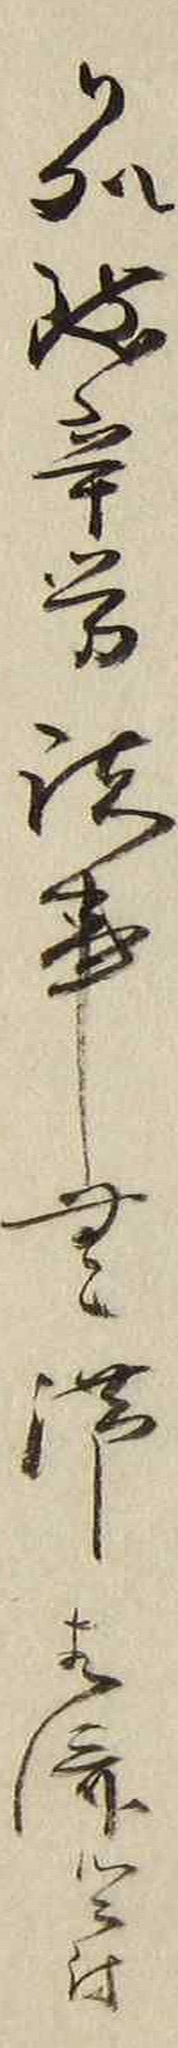候処致辛労諸事無滞相済候に付

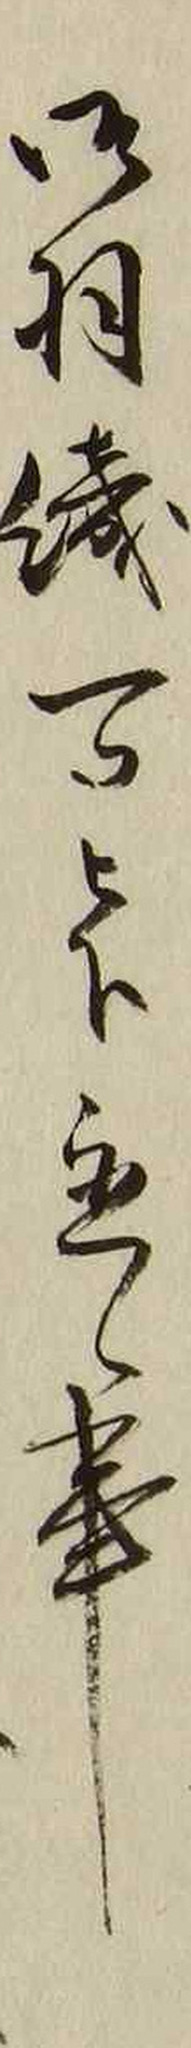御羽織一つ被下置候事
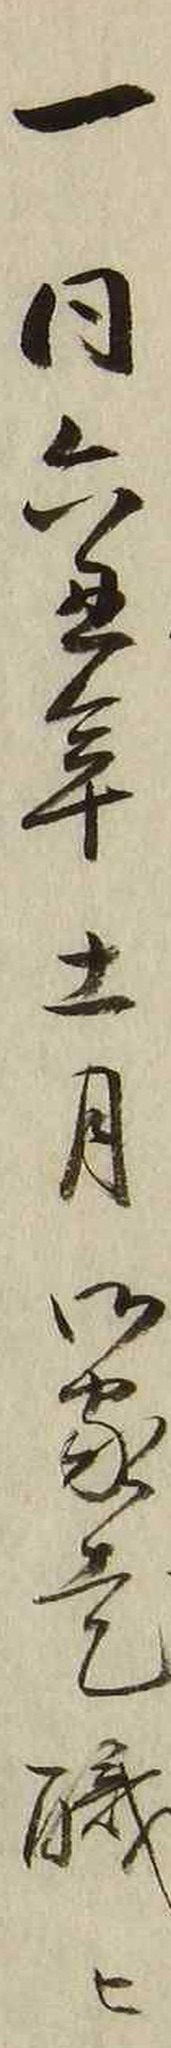一同六丑年十一月御家老職被
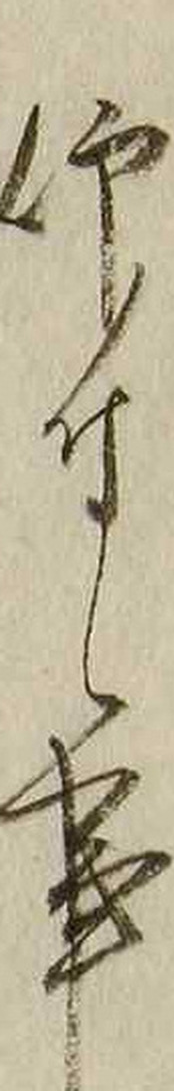仰付候事
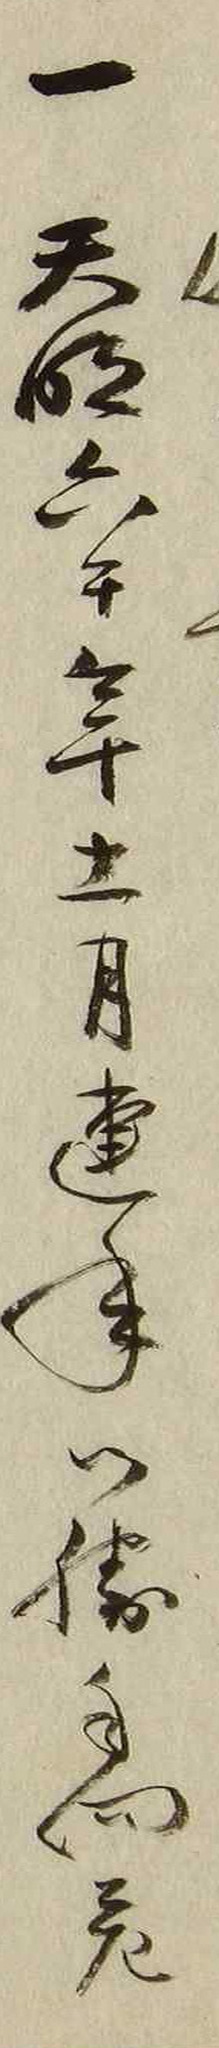一天明六午年十一月連年御勝手向差
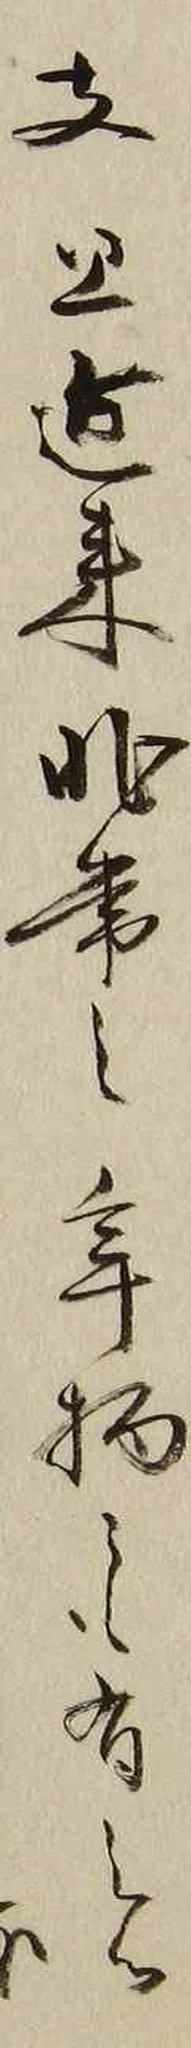支是迄來非常之年柄にも有之候
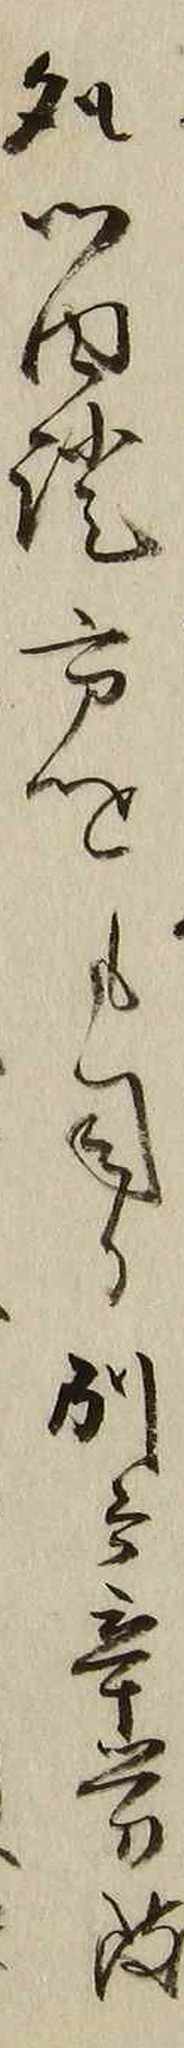処御内証方をも司り別而辛労致
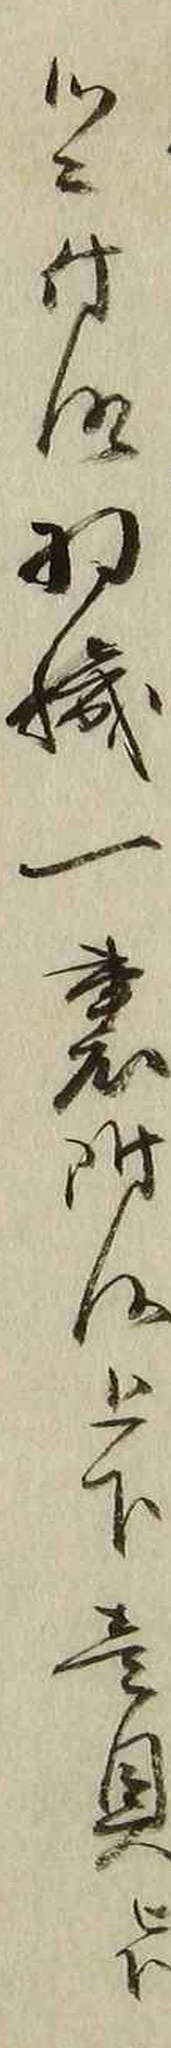候に付御羽織一裏付御上下壱具被下
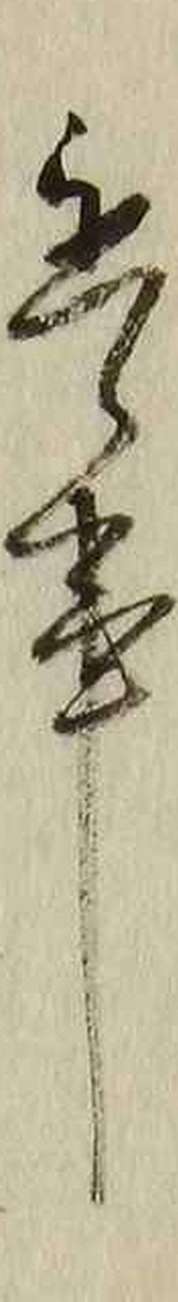置候事
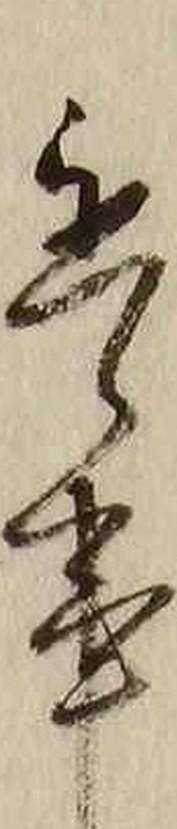置候事
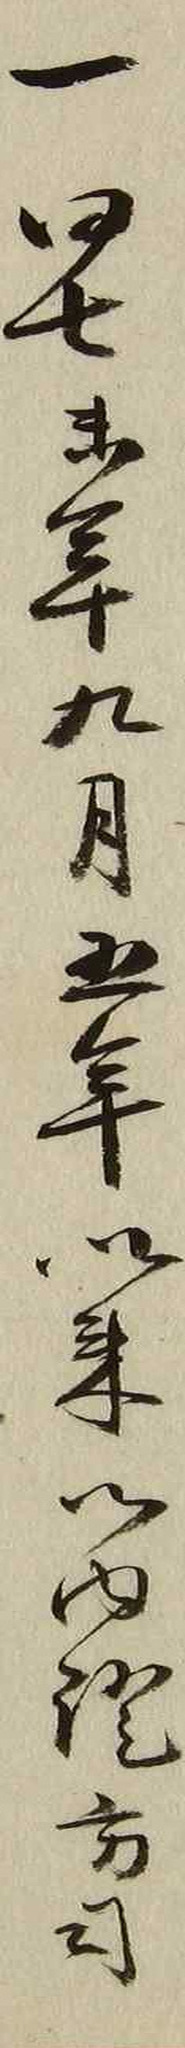一同七未年九月五年以来御内証方司
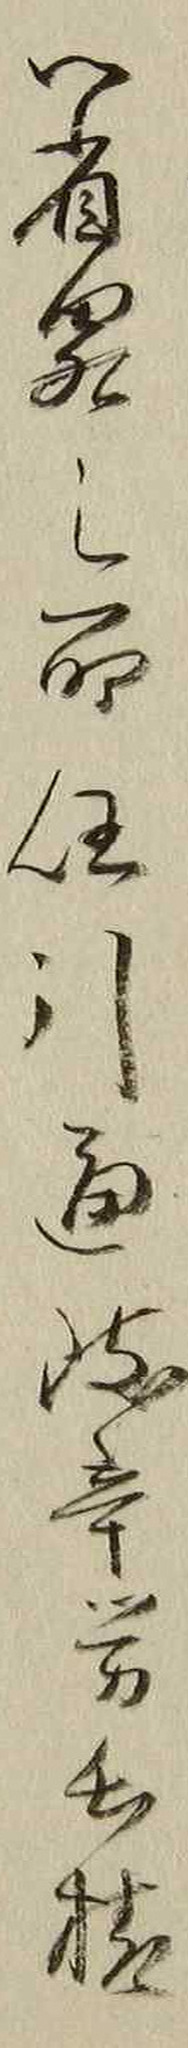御省略之筋任引通致辛労出精
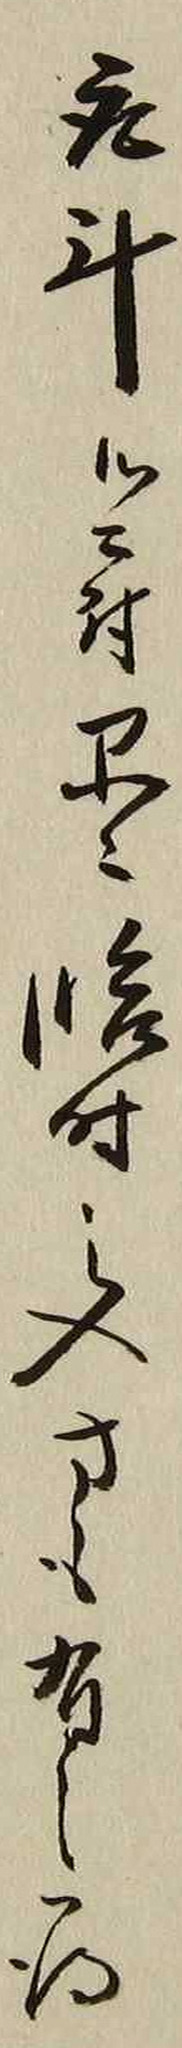取斗候に付品々臨時之〆方も有之候得
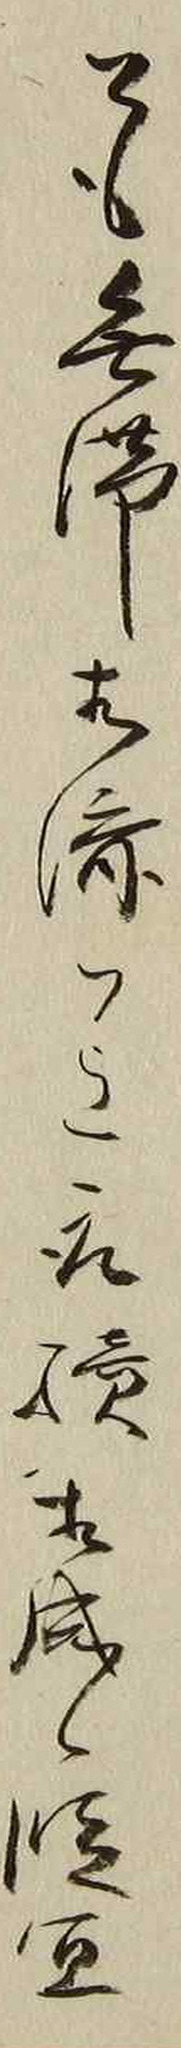とも無滞相済候迄取続相成候段宜
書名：諸士系譜　巻之292　き之部1
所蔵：会津若松市立会津図書館
